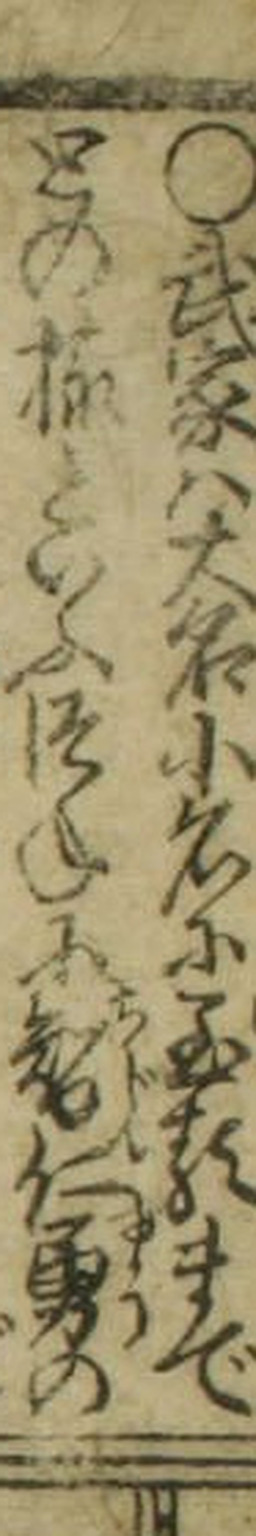との様といふつねに智仁勇の
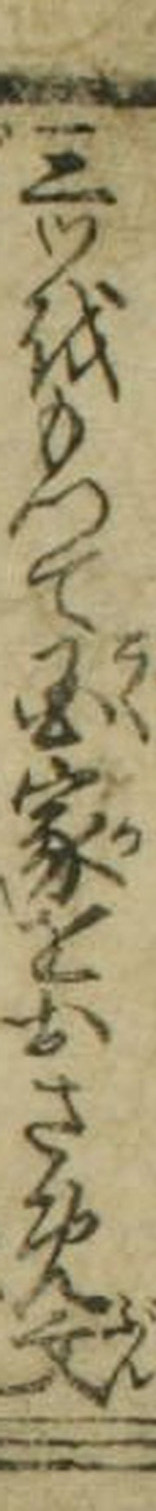三ッをもつて国家をおさめ文
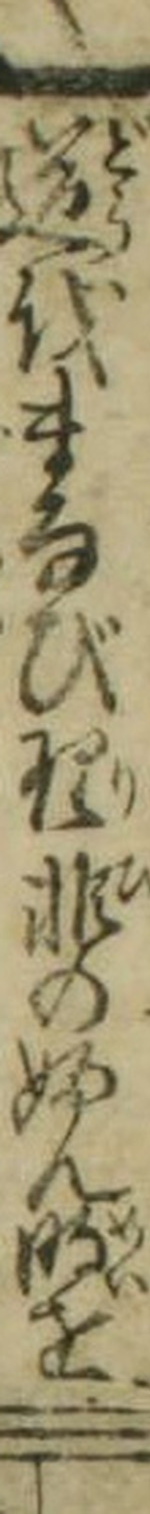道をまなび理非のふん明を
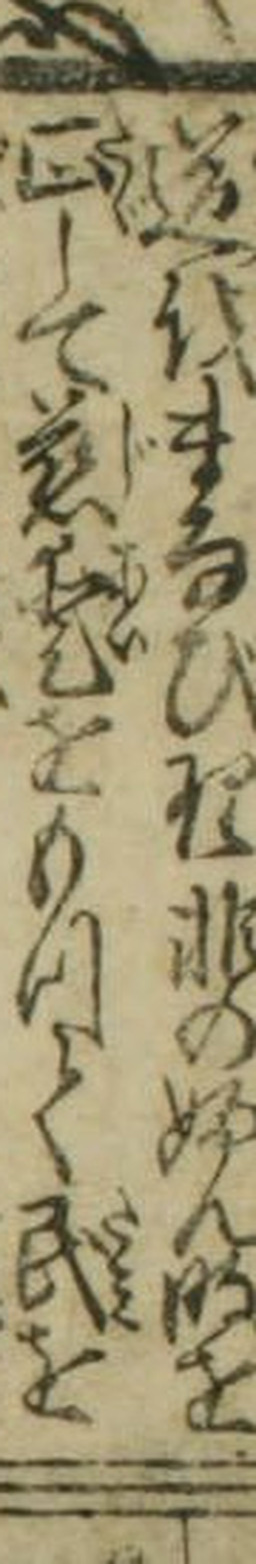正して慈愛をもつて民を
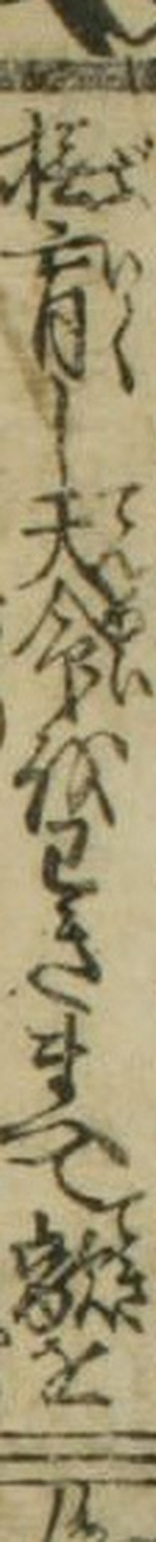撫育し天命をわきまへて敵を
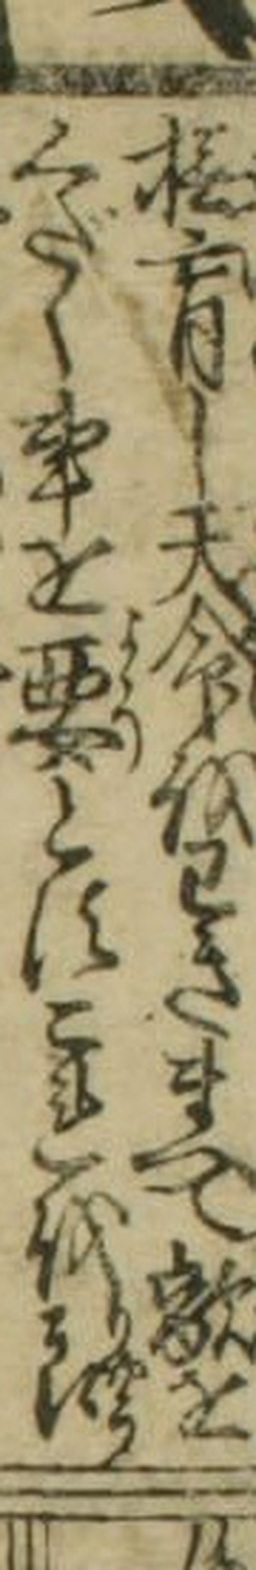くだく事を要とすこれを良
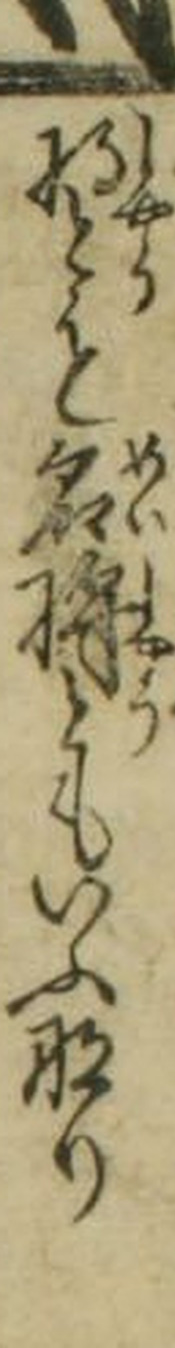将とも名将ともいふなり
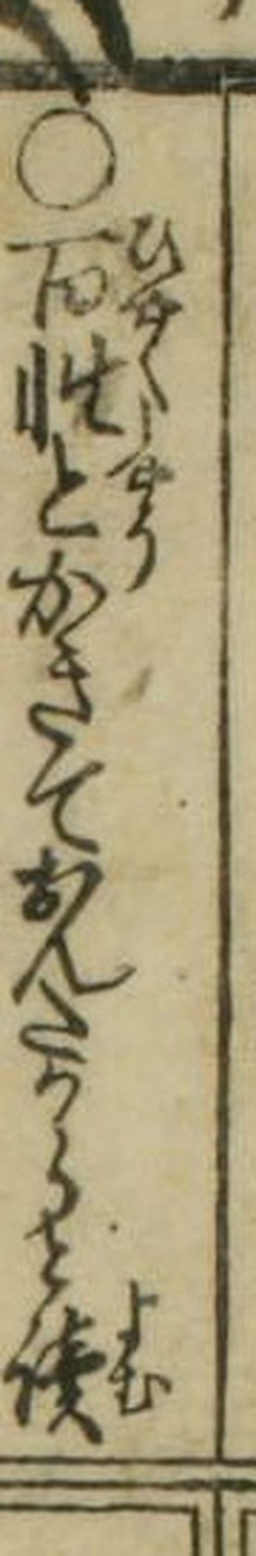○百姓とかきておんたからと読
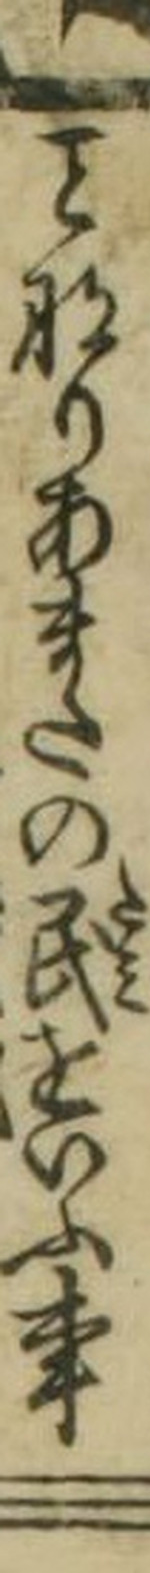ことなりあまたの民をいふ事
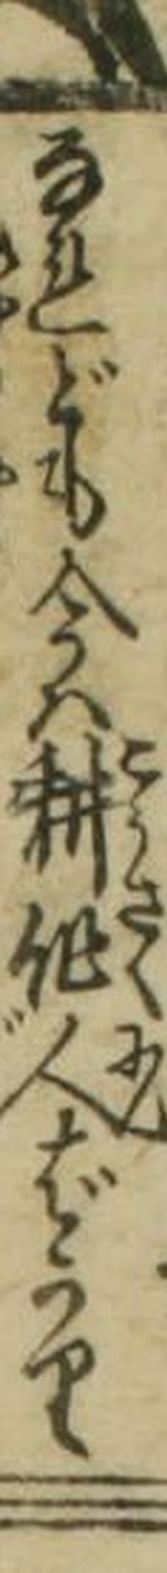なれども今は耕作人ばかり
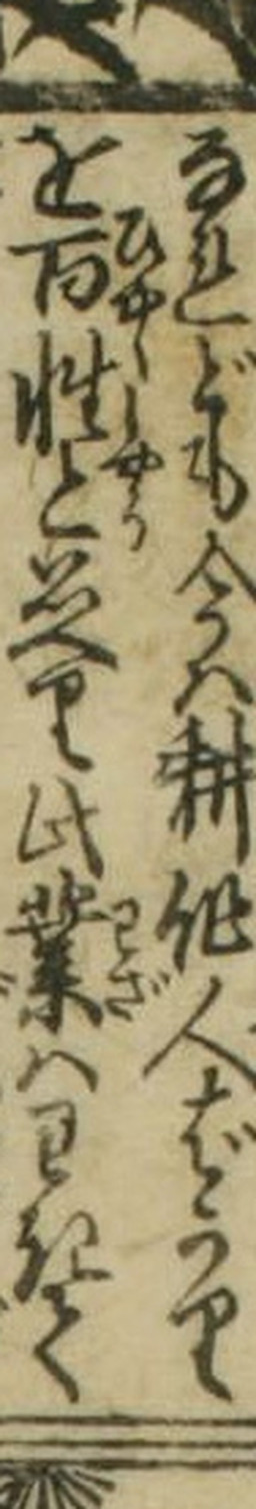を百姓と思へり此業はわきて
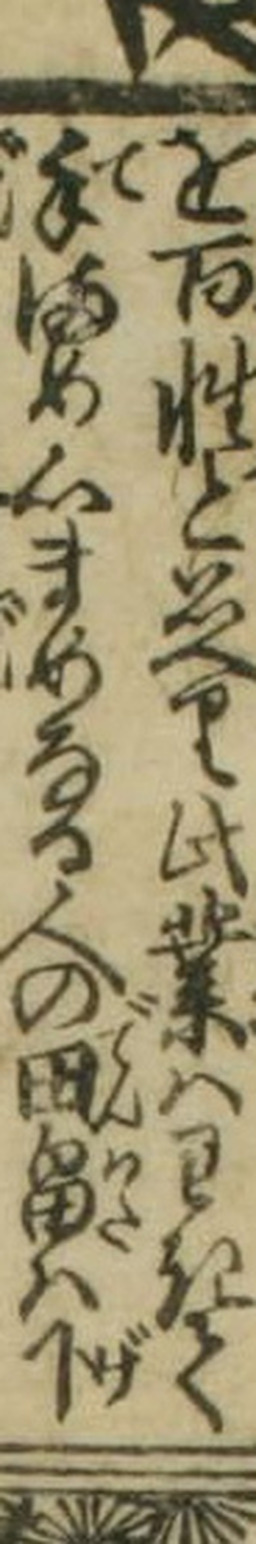手まめ心まめなる人の田畠は下
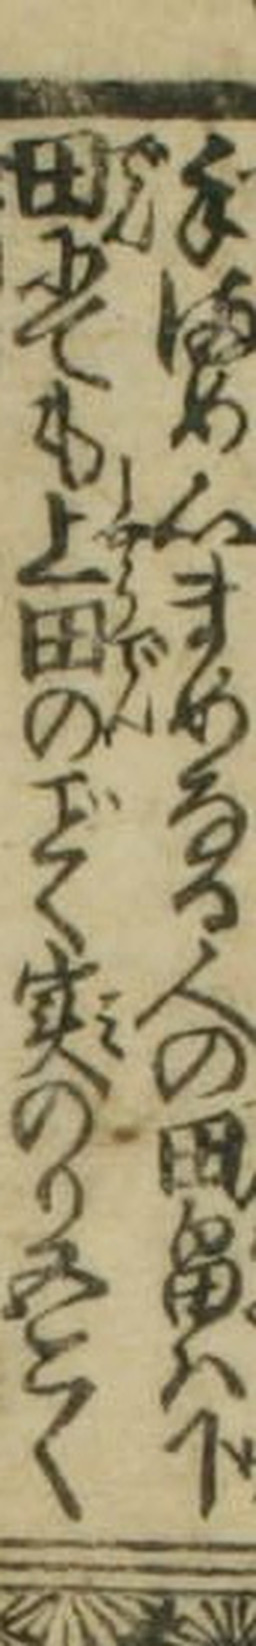田にても上田のごとく実のり五こく
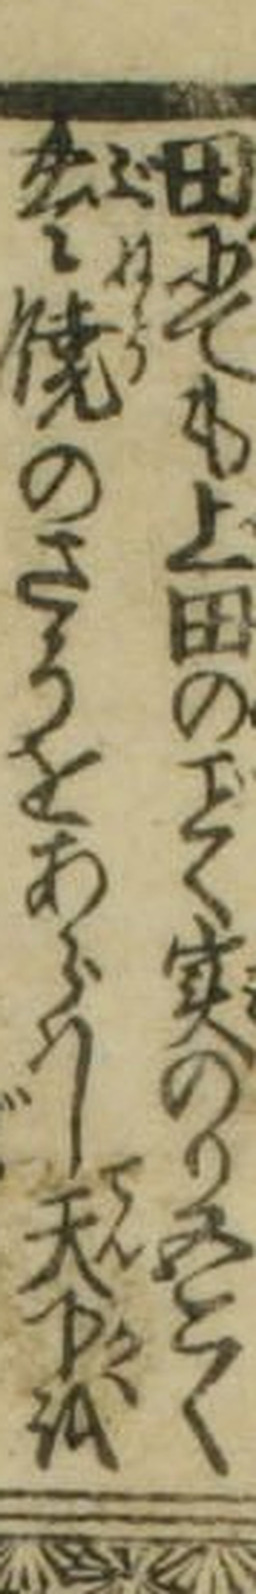豊饒のさうをあらはし天下を
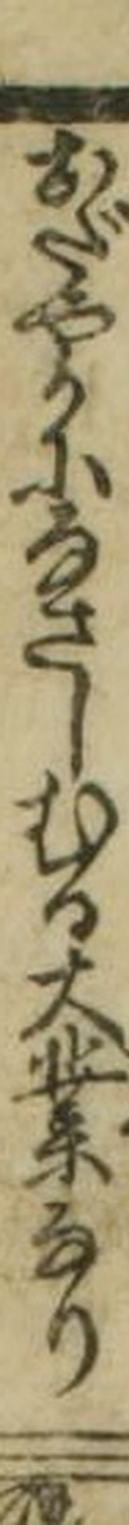おだやかになさしむる大業なり
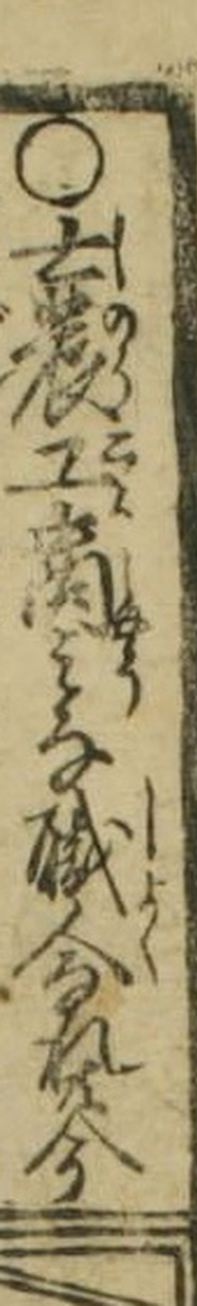○士農工商みな職人なれ共今
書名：増補職人往来
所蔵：東京学芸大学教育コンテンツアーカイブ
